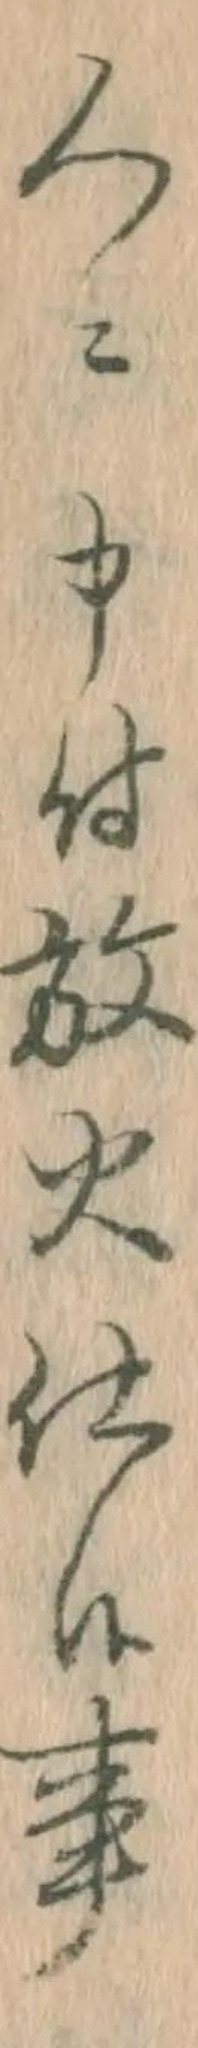人に申付放火仕候事
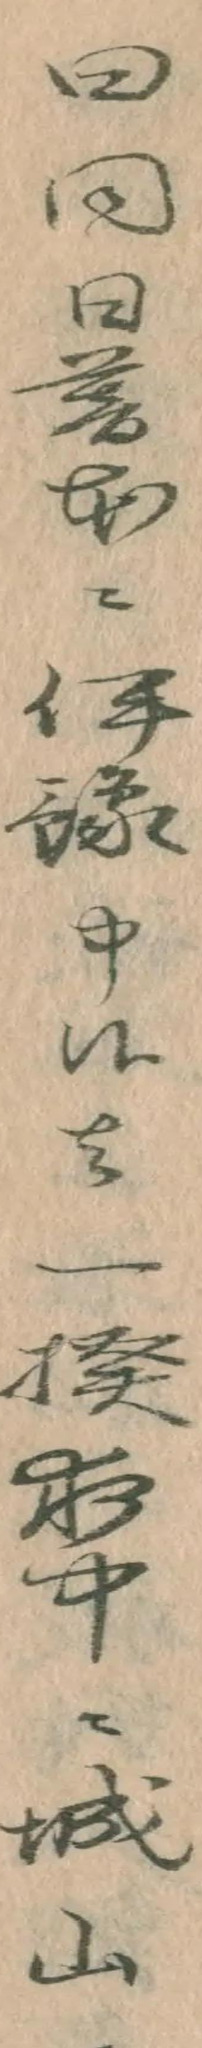又曰同日暮本に伊予申候は一揆夜中に城山に
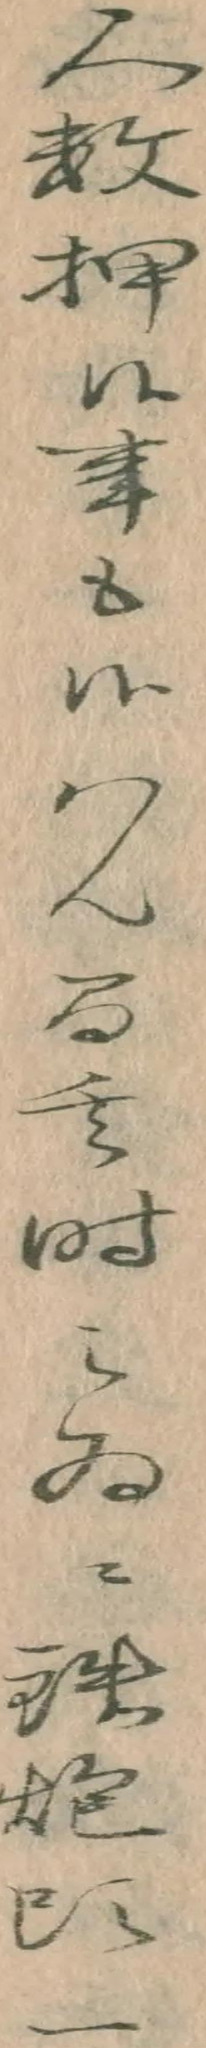人数押候事も候はん間其時之為に鉄炮頭一
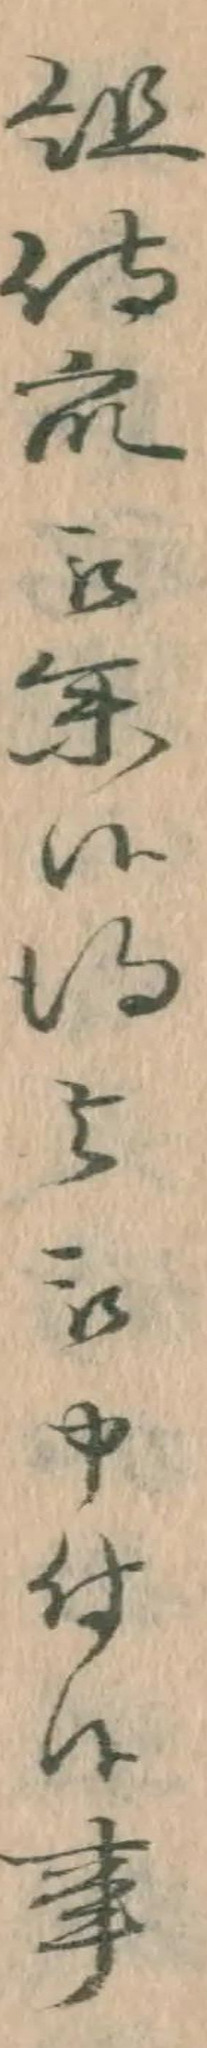組侍衆被参候得と被申付候事
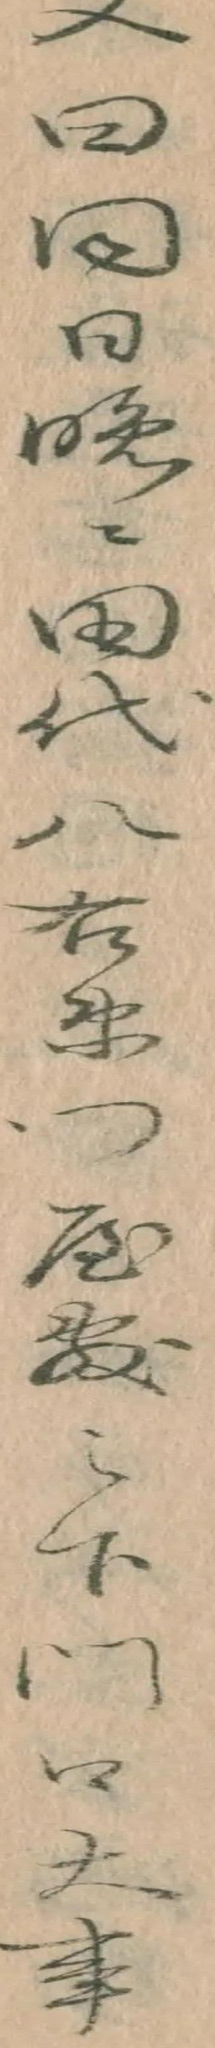又曰同日晩に田代八右衛門屋敷之下門口大事
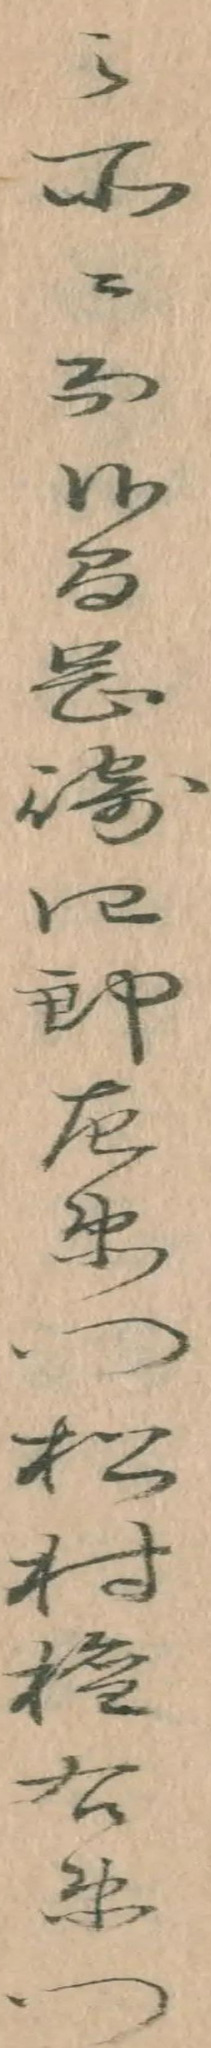之所に而候間岡崎四郎左衛門松村権右衛門
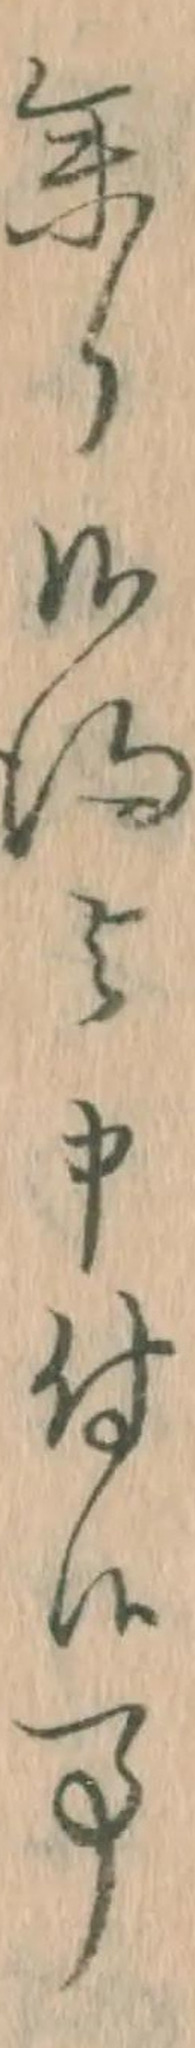参り候得と申付候事
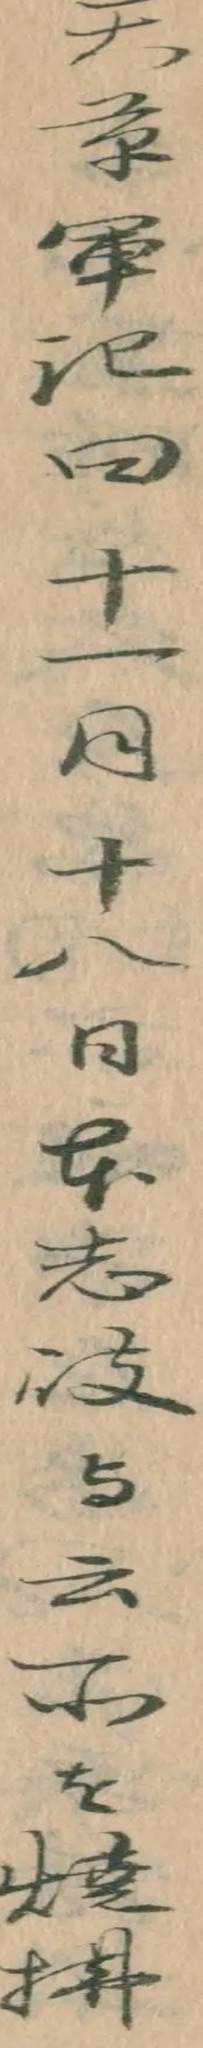天草軍記曰十一月十八日本志岐と云所を焼払
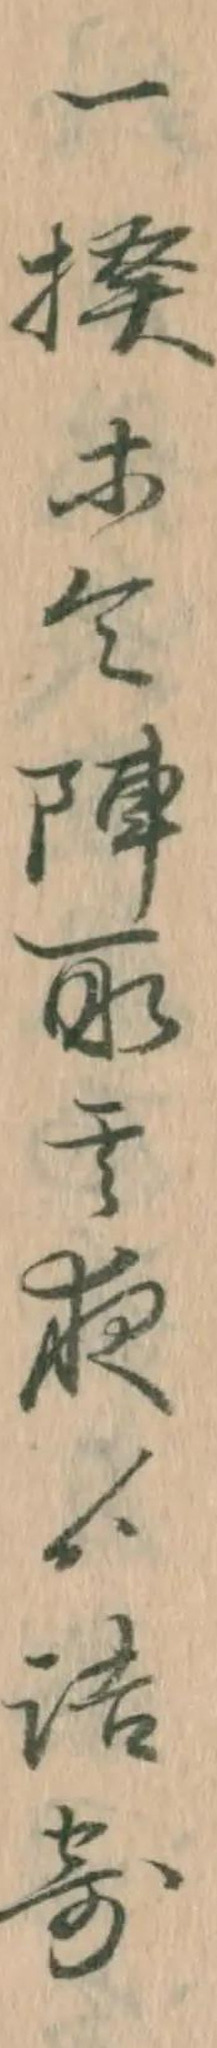一揆等令陣取其夜ゟ詰寄
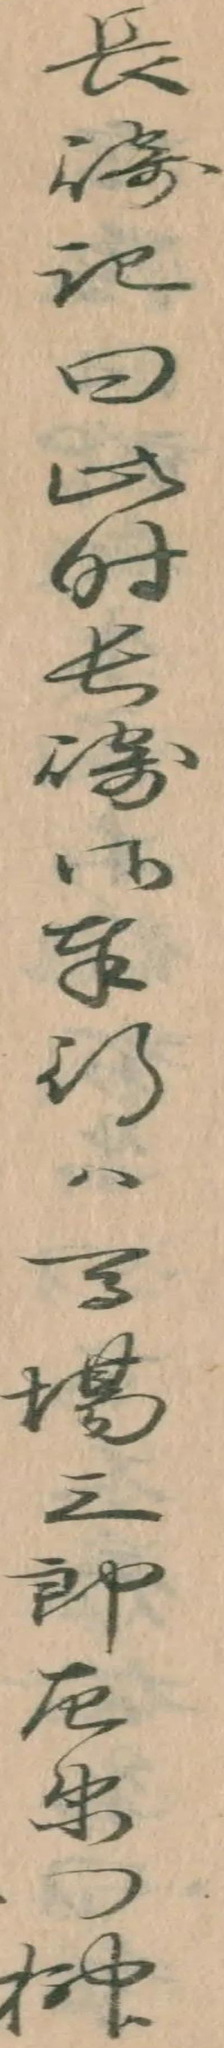長崎記曰此時長崎御奉行は馬場三郎左衛門榊
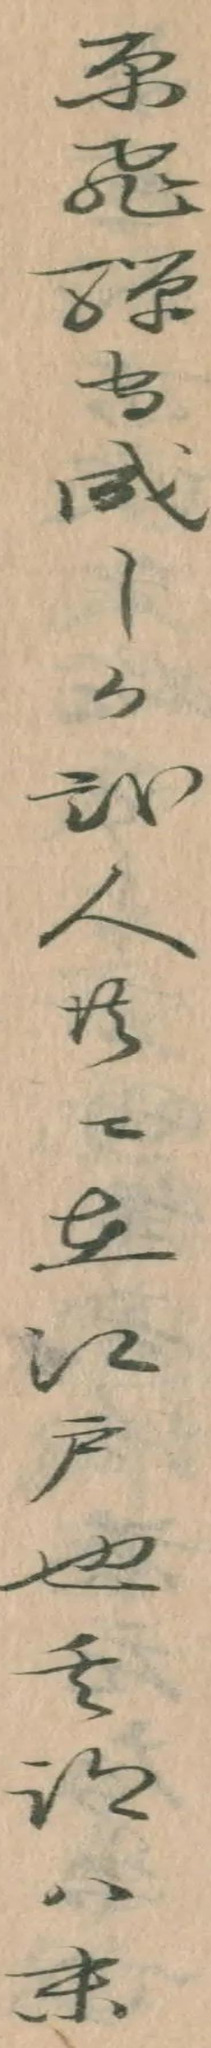原飛騨守成しか弐人共に在江戸也其跡は末
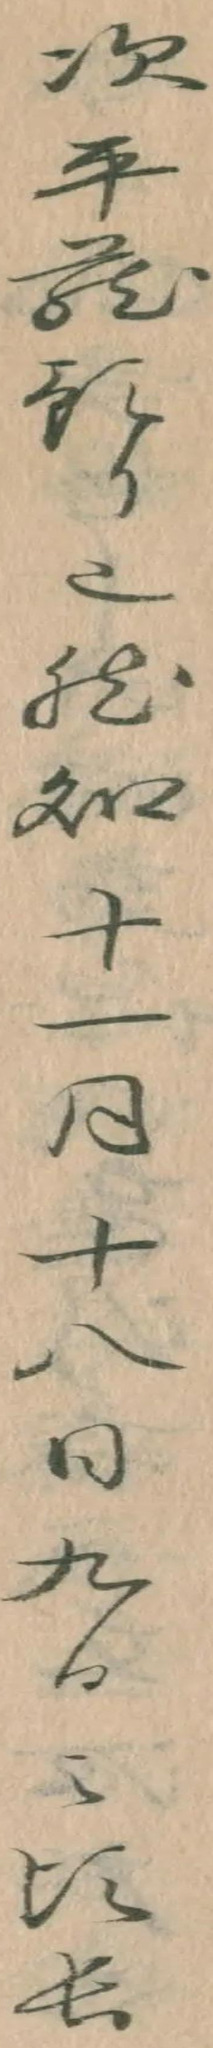次平蔵預り也然処十一月十八日九日之頃長
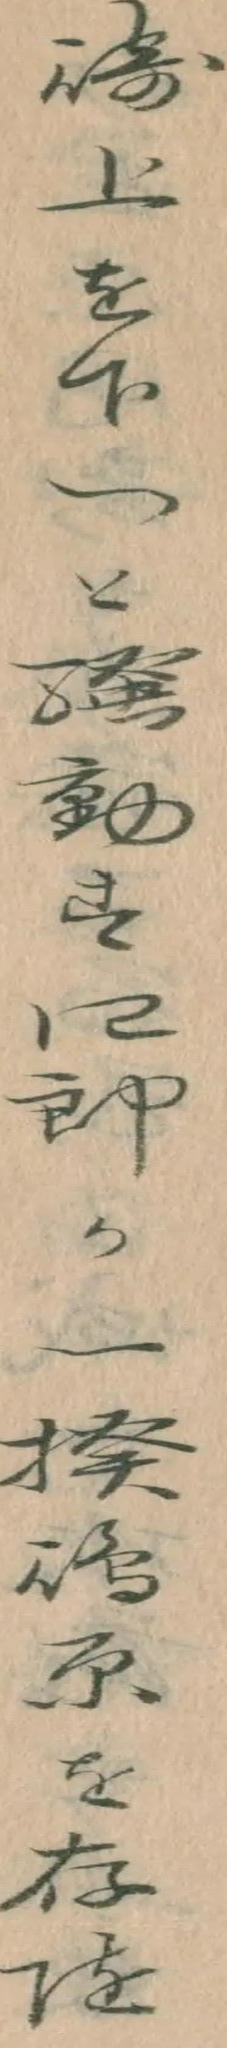崎上を下へと騒動す四郎か一揆島原を存随
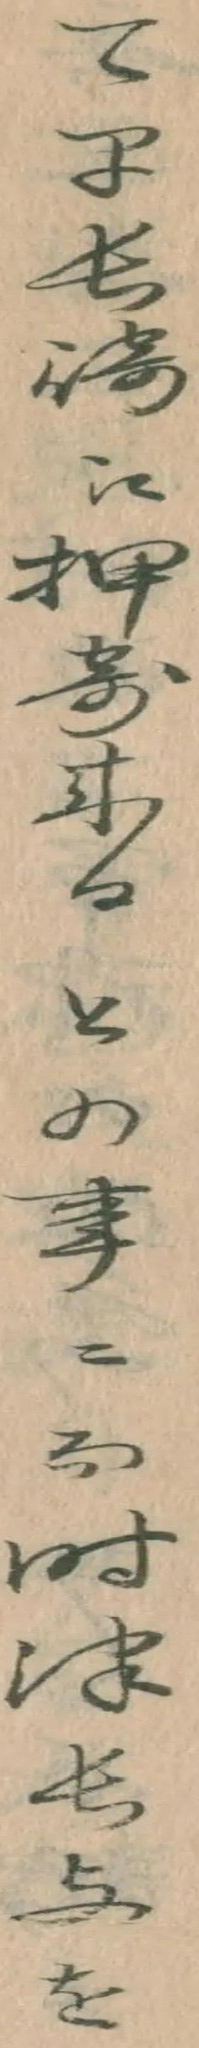て早長崎江押寄来るとの事に而時津長与を
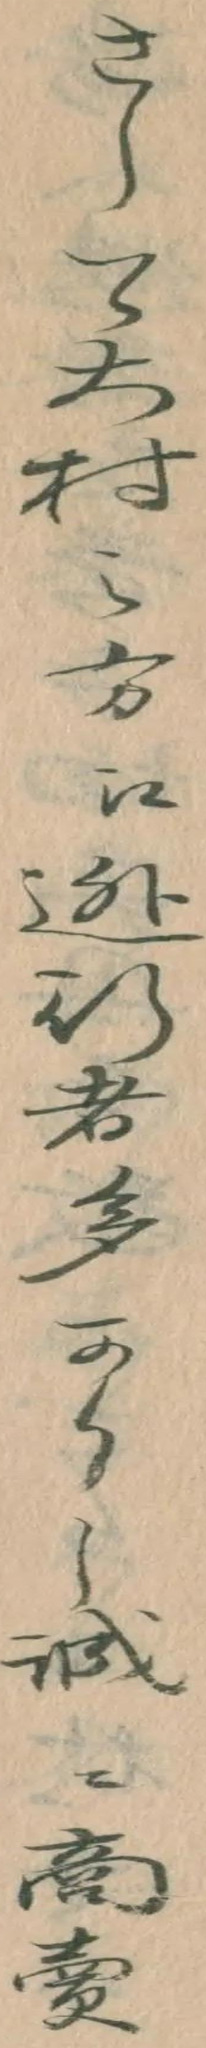さして大村之方江逃行者多かりし誠に商売
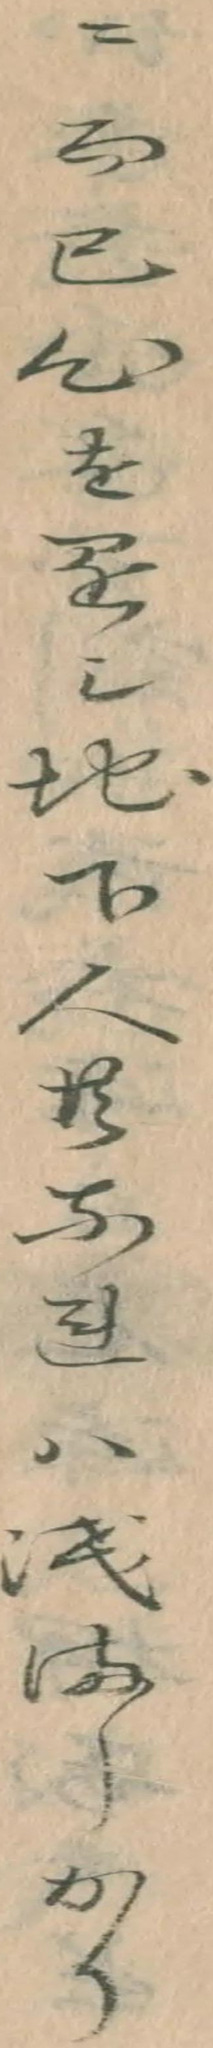に而已心を懸シ地下人共なれは浅ましかり
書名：切支丹御退治記 49巻. [3]
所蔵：国立国会図書館 National Diet Library, JAPAN
